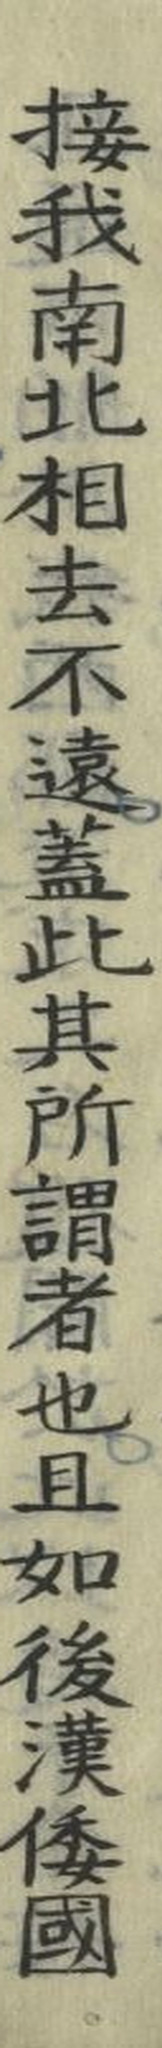接我南北相去不遠。蓋此其所謂者也。且如後漢倭國
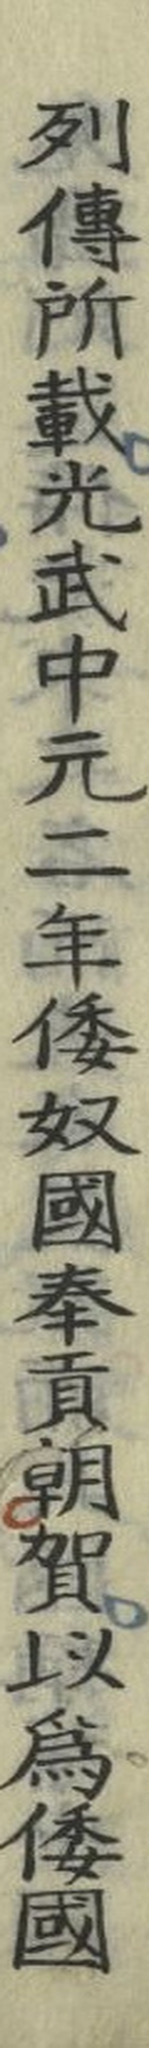列傳所載。光武中元二年倭奴國奉貢朝賀。以爲倭國
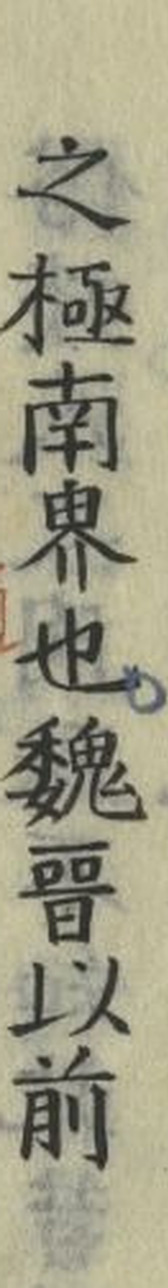之極南界也。魏晉以前
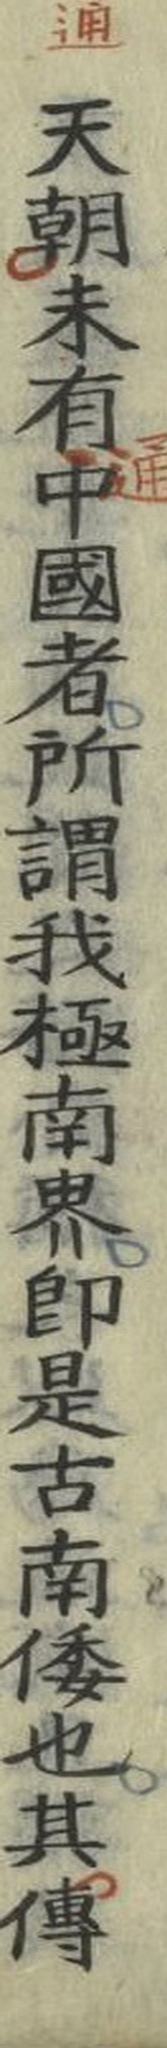天朝未有通中國者。所謂我極南界。卽是古南倭也。其傳
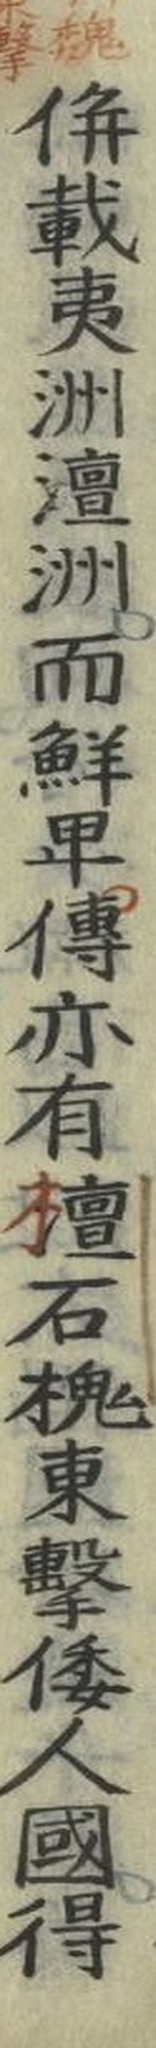併載夷洲澶洲。而鮮卑傳亦有亶檀石槐東擊倭人國。得
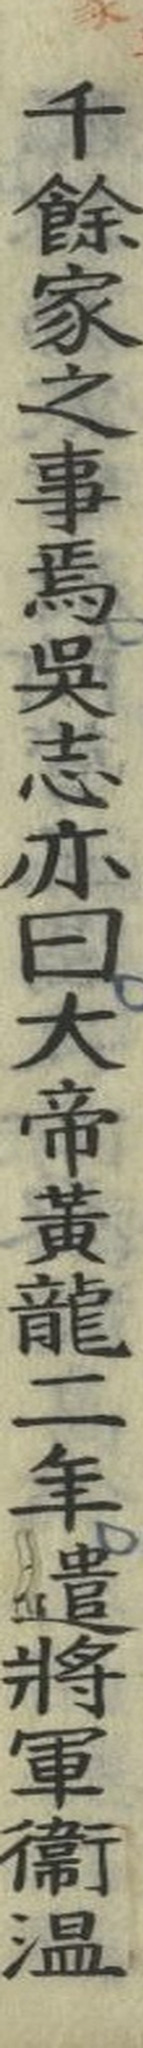千餘家之事焉。呉志亦曰。大帝黃龍二年。遣將軍衞温
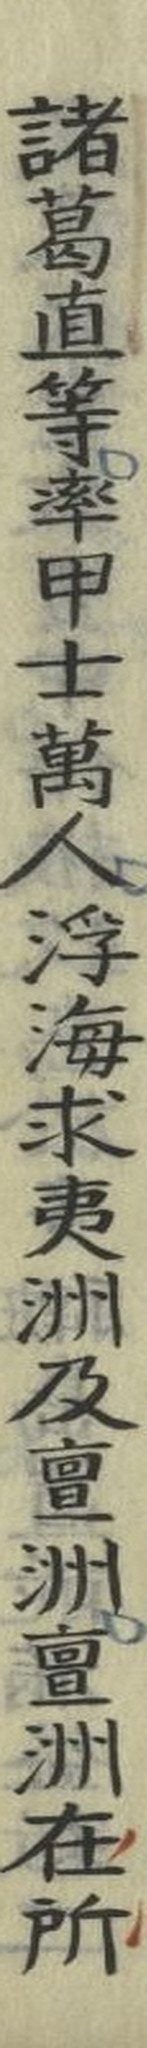諸葛直等。率甲士萬人。浮海求夷洲及亶洲。亶洲在所
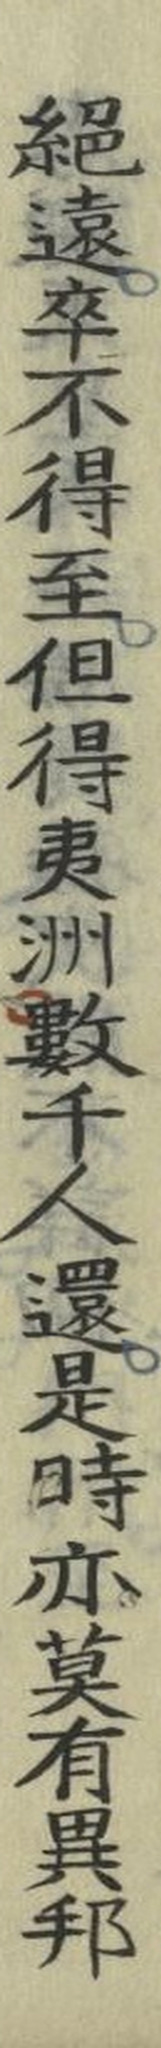絕遠。卒不得至。但得夷洲數千人還。是時亦莫有異邦
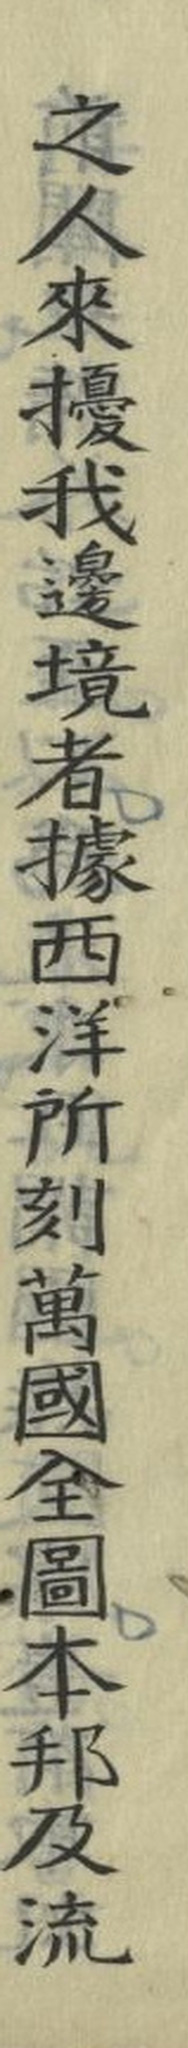之人來擾我邊境者。據西洋所刻萬國全圖。本邦及流
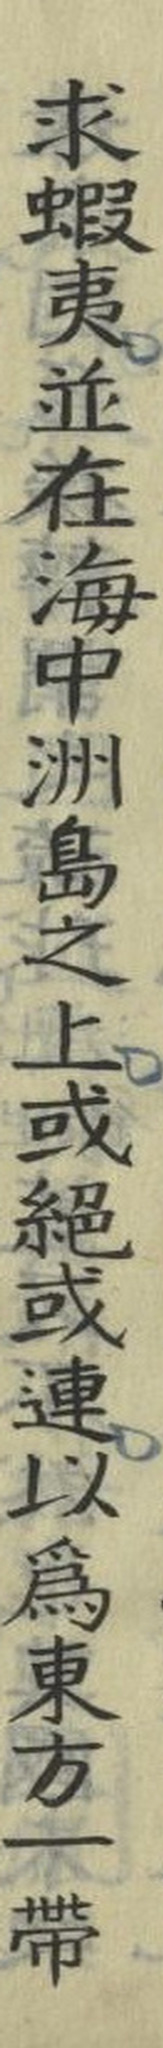求蝦夷。並在海中洲島之上。或絕或連。以爲東方一帶
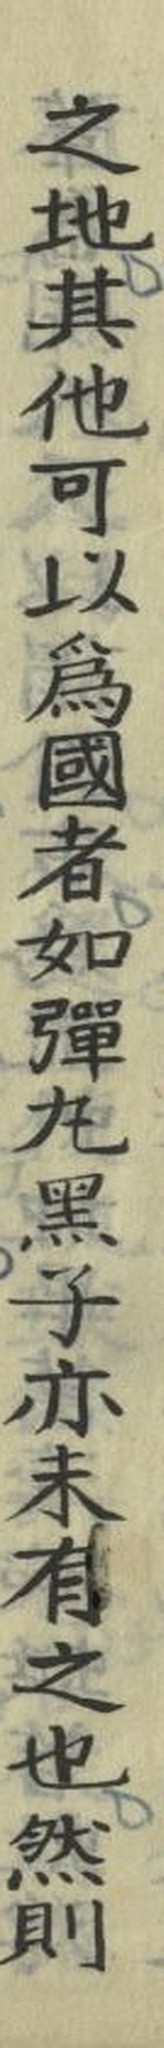之地。其他可以爲國者。如彈丸黑子亦未有之也。然則
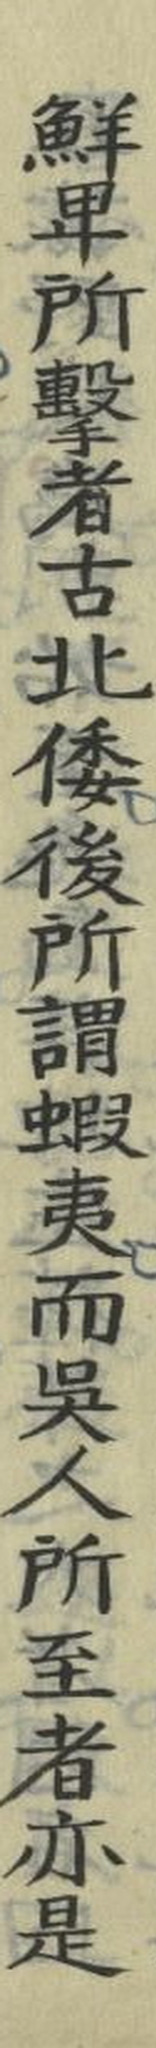鮮卑所擊者古北倭。後所謂蝦夷。而呉人所至者亦是
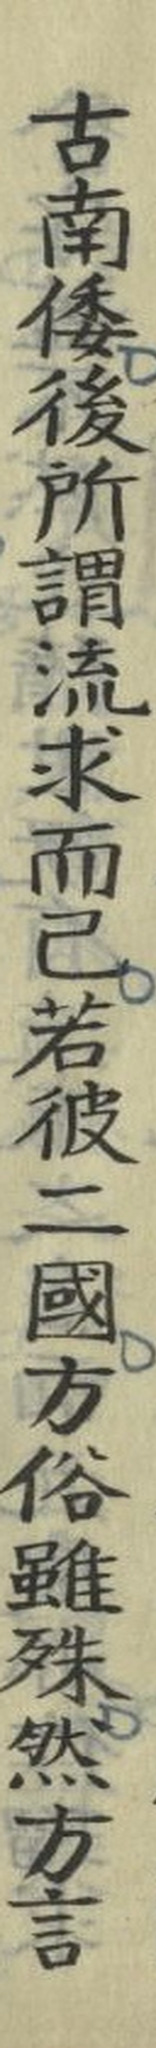古南倭。後所謂流求而已。若彼二國。方俗雖殊。然方言
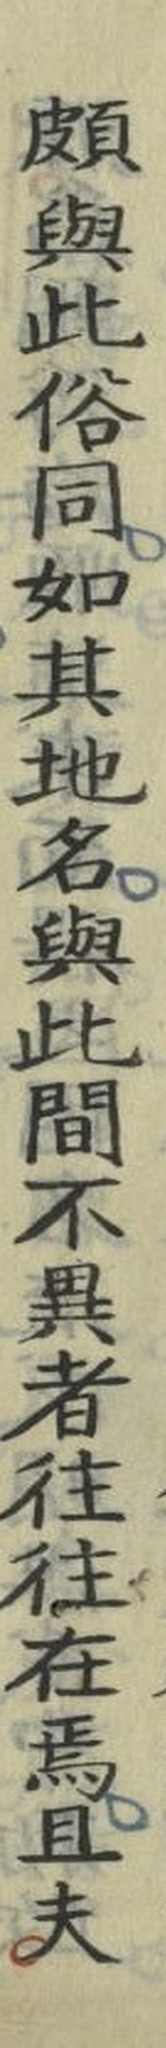頗與此俗同。如其地名。與此間不異者往往在焉。且夫
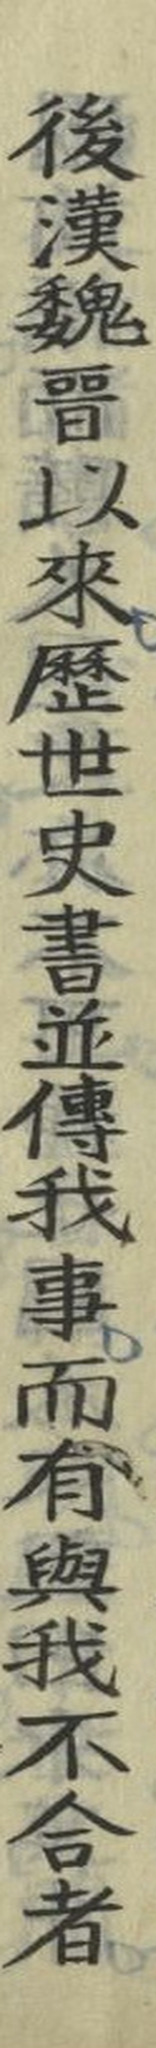後漢魏晉以來。歷世史書並傳我事。而有與我不合者。
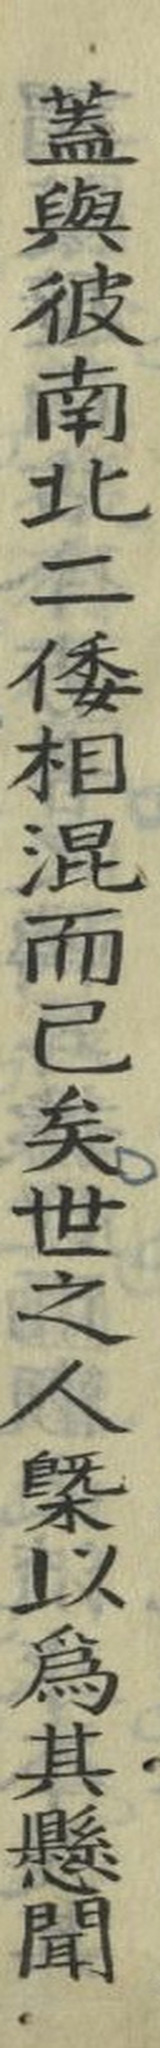蓋與彼南北二倭相混而已矣。世之人槩以爲其懸聞
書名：南島志
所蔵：University of the Ryukyus Library
